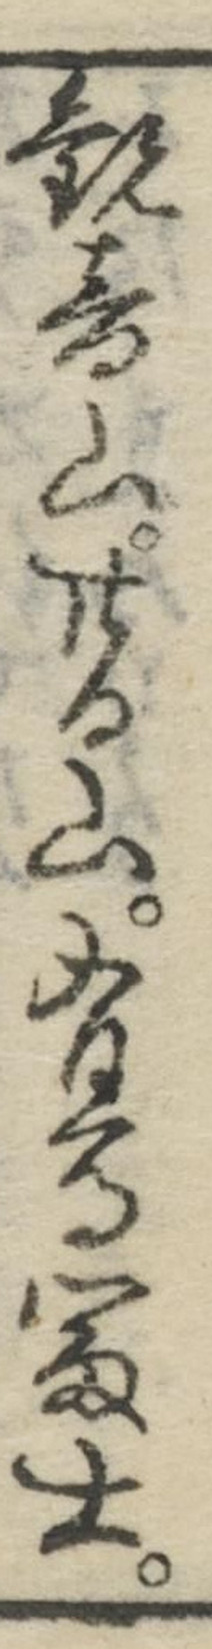観音山。廿日山。有馬冨士。
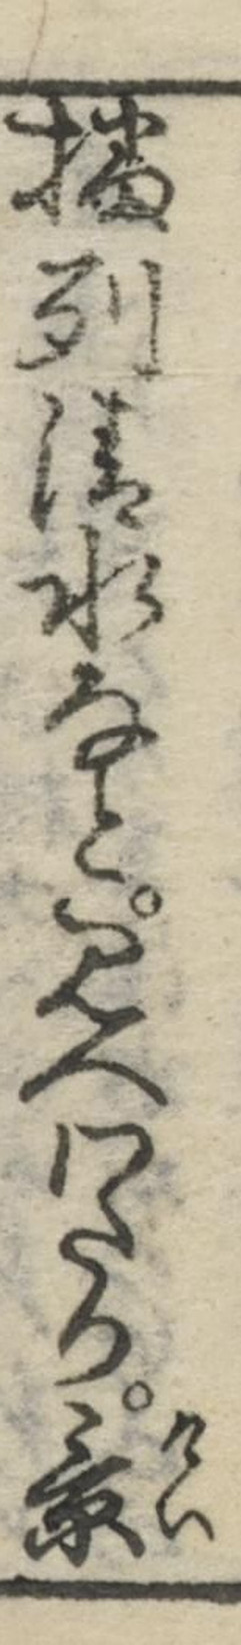播州清水なと。見へわたり。景
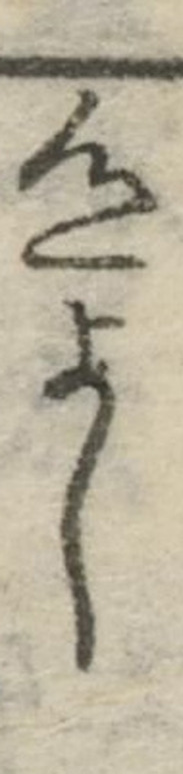色よし

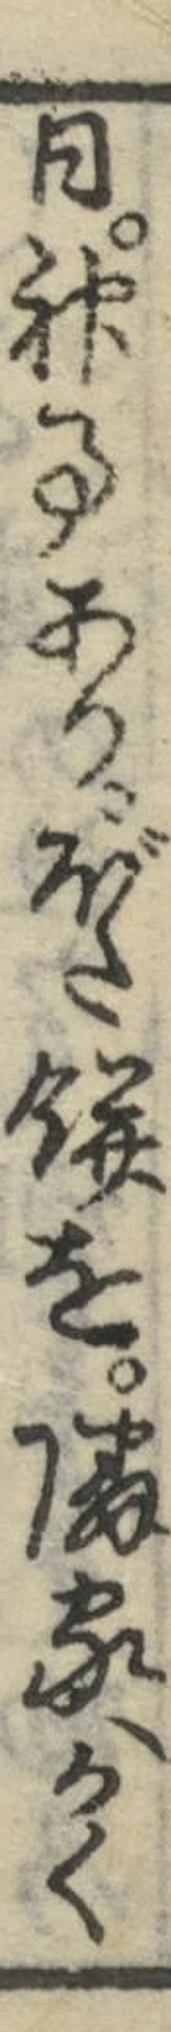日。神事あり。ぼた餅を隣家へかく
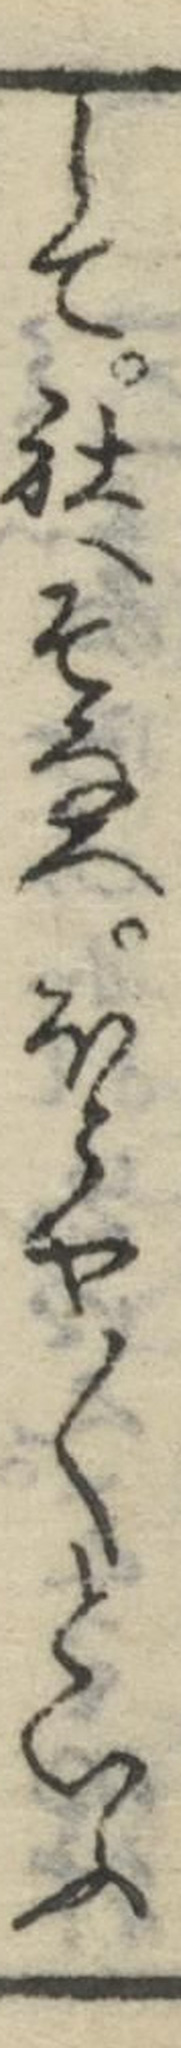して。社へそなへ。ほうや〳〵といふ
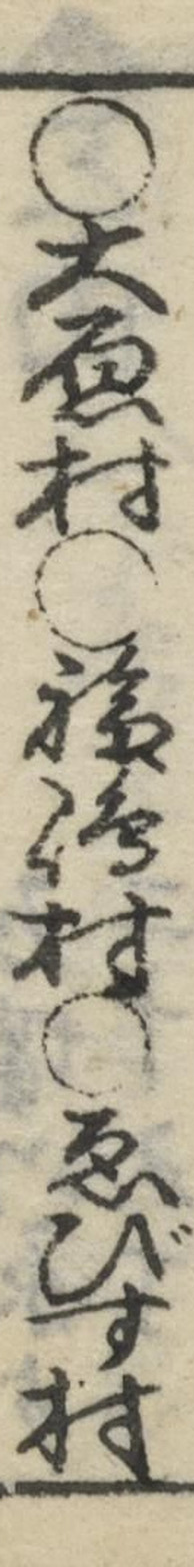○大原村○福嶋村○ゑびす村
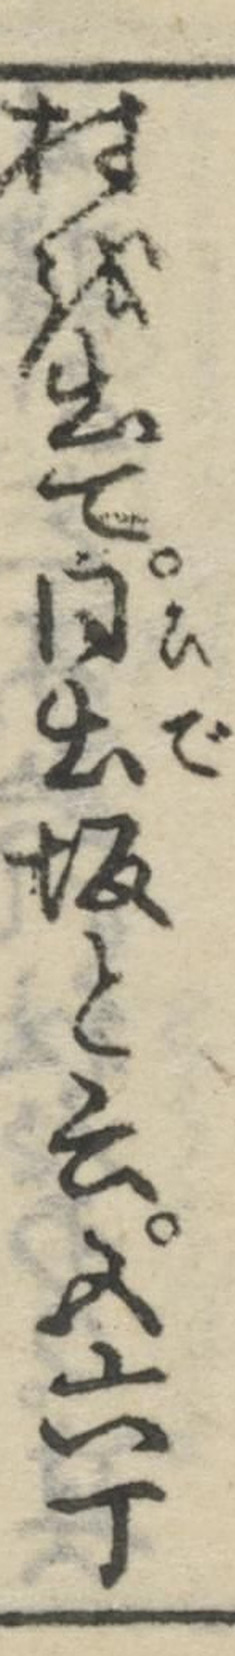村を出て。日出坂と云。五六丁
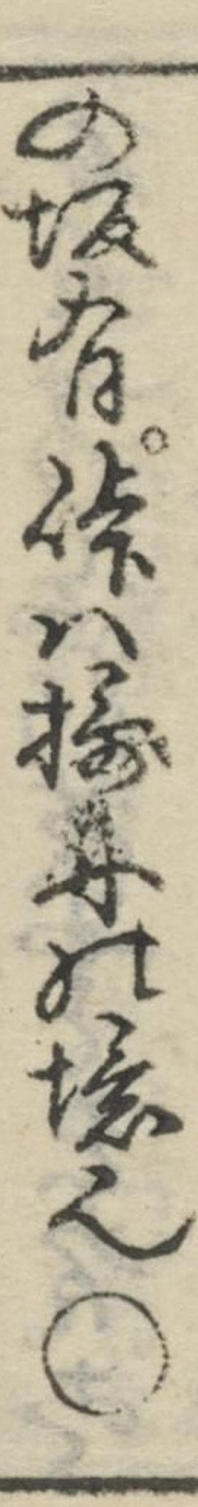の坂有。峠は摂丹の境也○
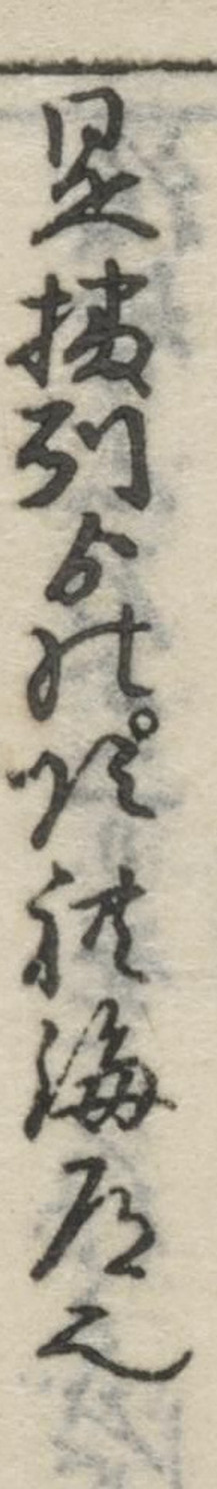是播州ゟの。順礼海道也
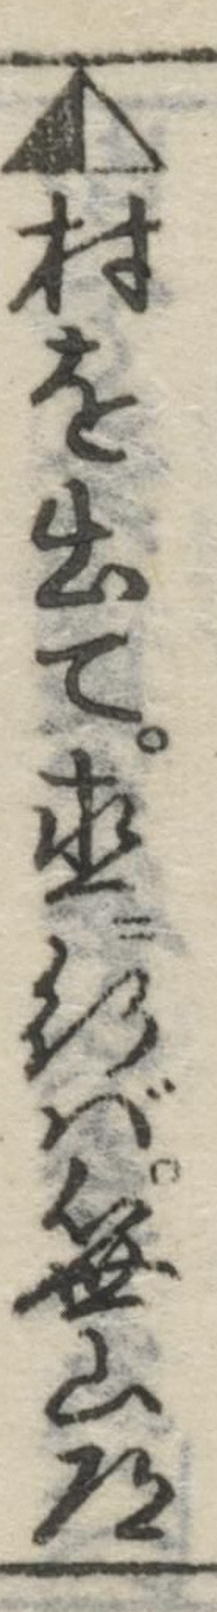▲村を出て。直に行ば。笹山道
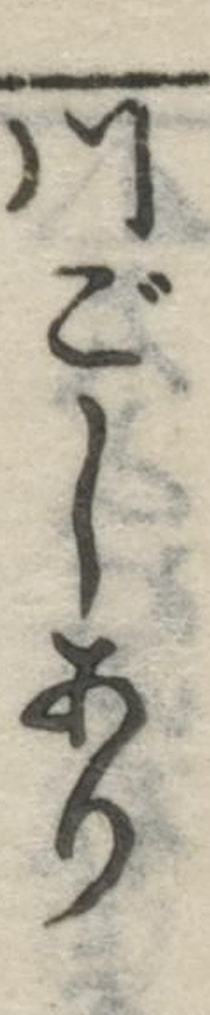川ごしあり

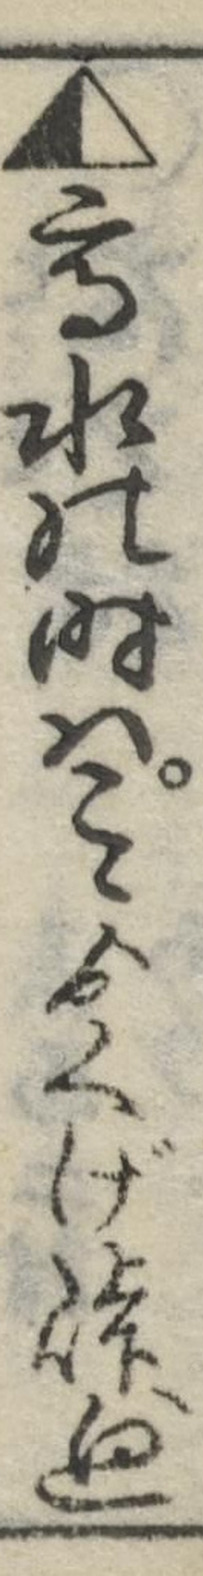▲高水の時は。こゝゟくげ峠へ廻
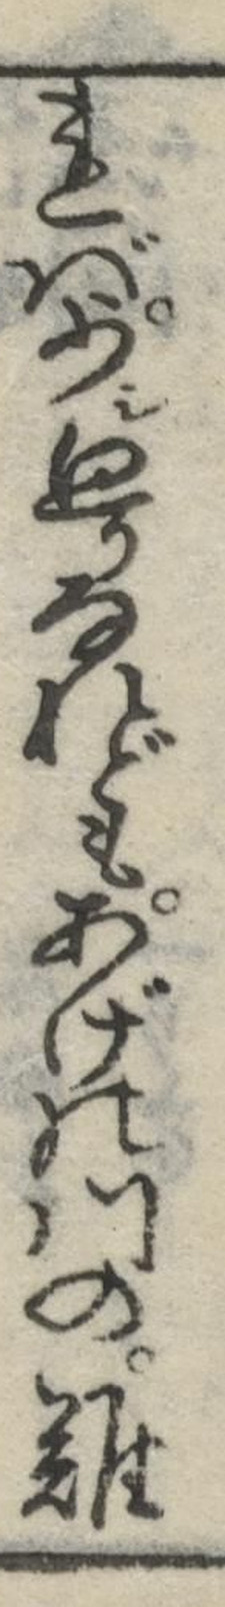れば少し廻りなれども。あげの川の。難
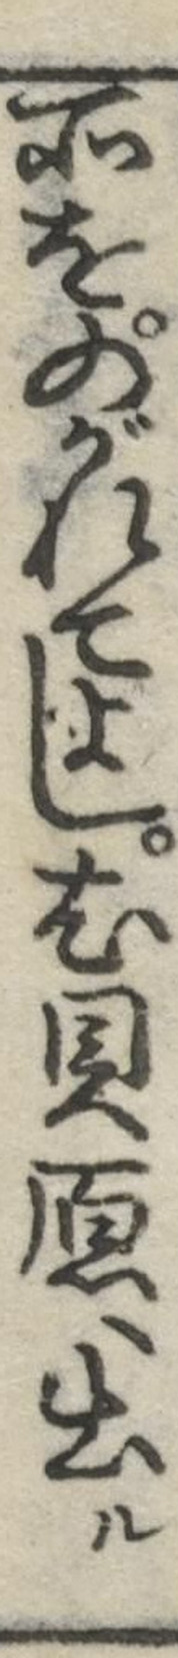所を。のがれてよし。尤貝原へ出る
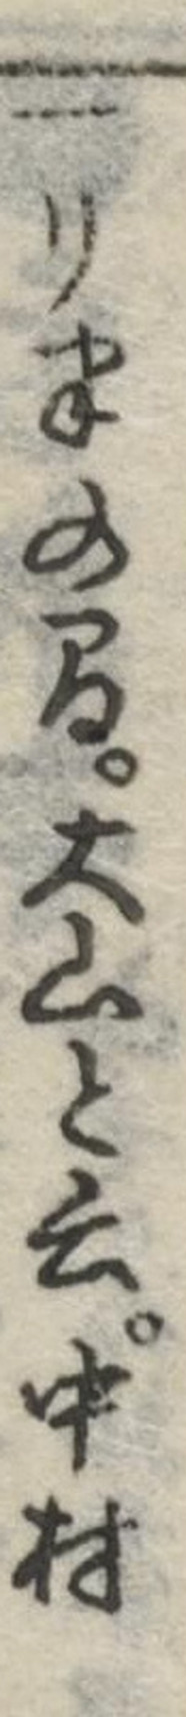一り半の間。大山と云。中村
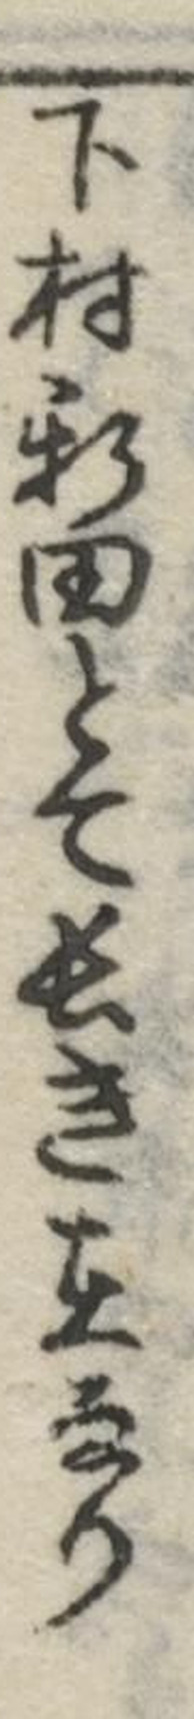下村新田とて長き在なり
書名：但州城崎浴湯辧
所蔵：東京大学地震研究所図書室 Earthquake Research Institute Library, The University of Tokyo, JAPAN
